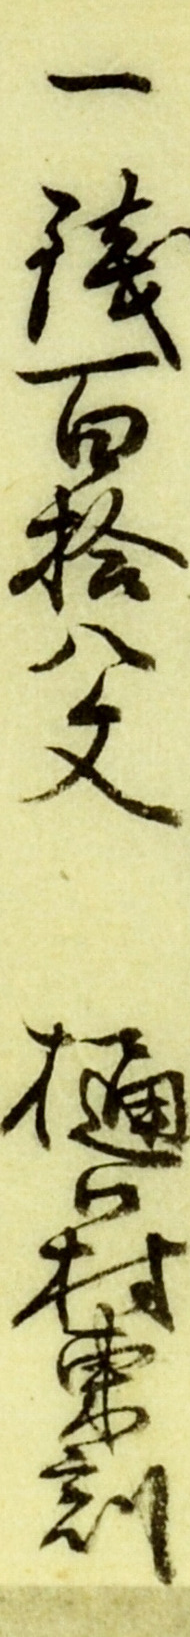一銭百拾八文樋口村東割
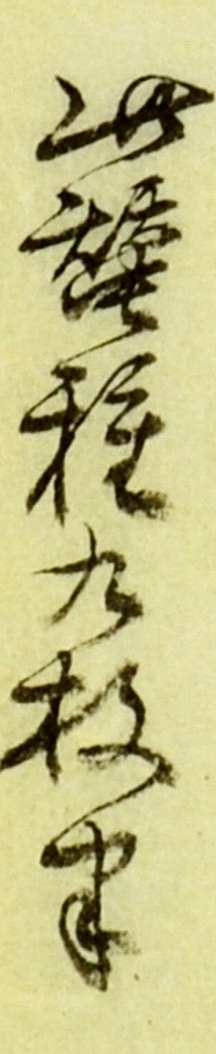此蚕種九枚半
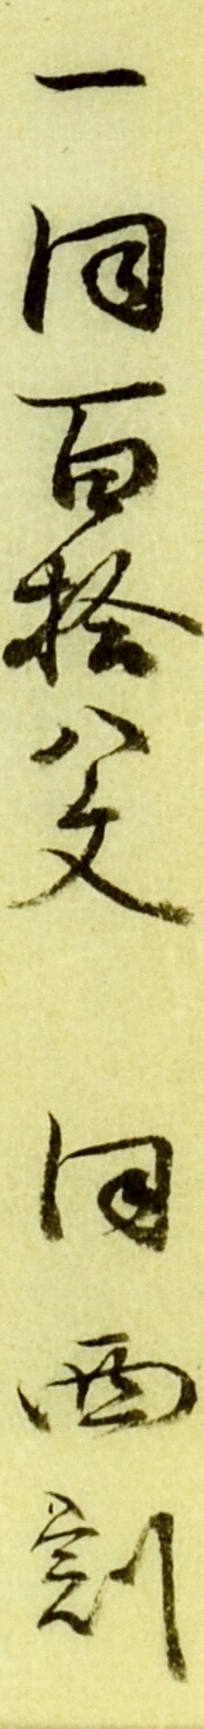一同百拾八文同西割
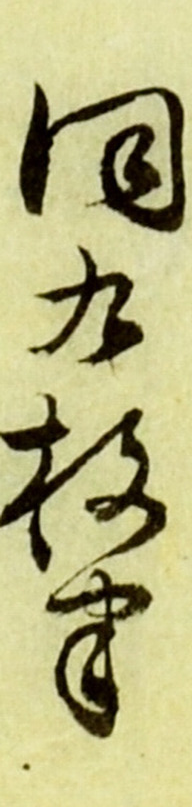同九枚半
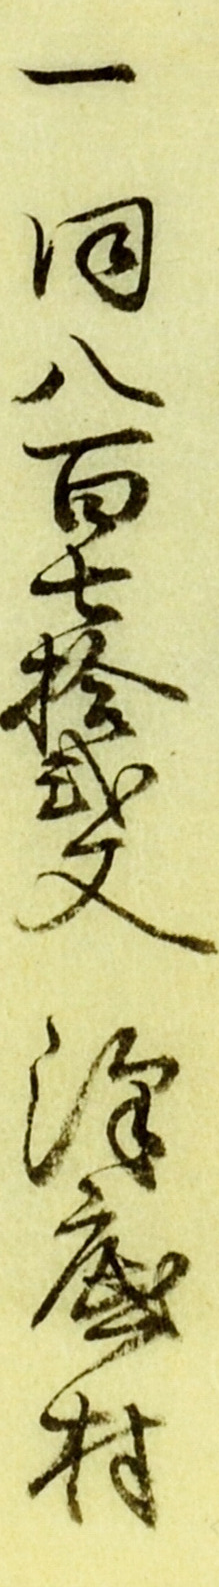一同八百七拾弐文沢底村
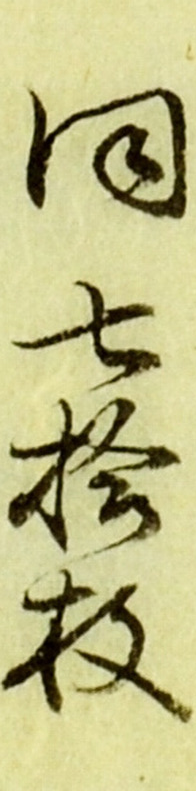同七拾枚
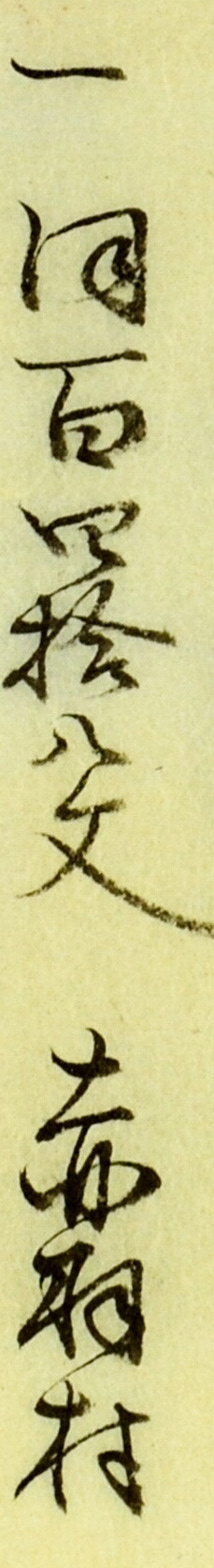一同百四拾八文赤羽村
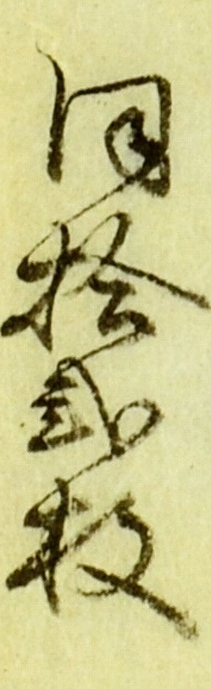同拾弐枚
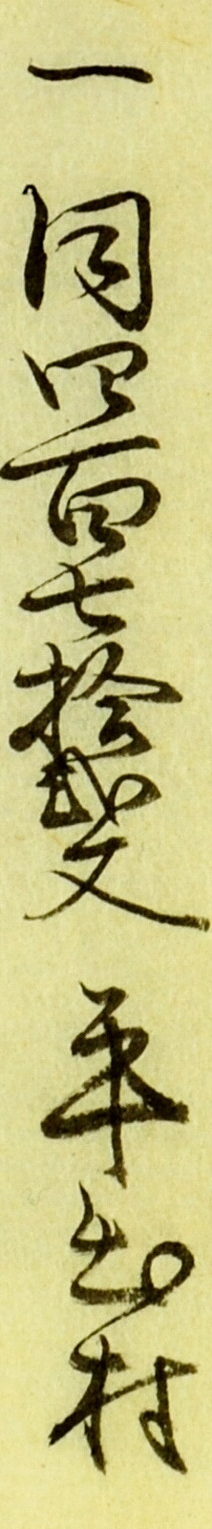一同四百七拾弐文平出村
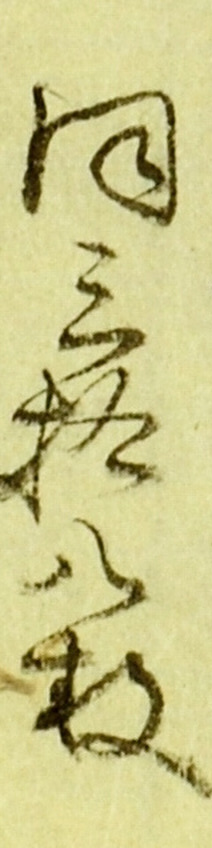同三拾八枚
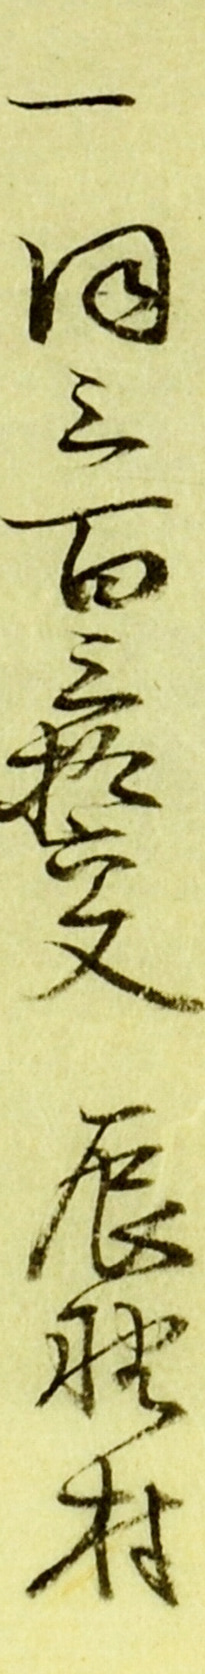一同三百三拾六文辰野村
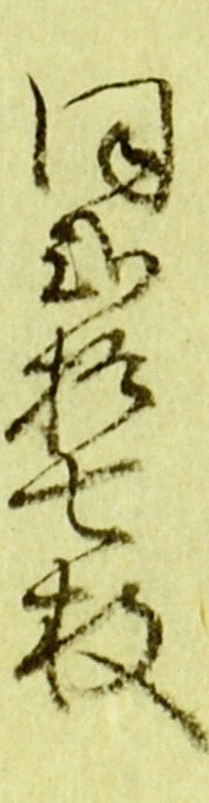同弐拾七枚
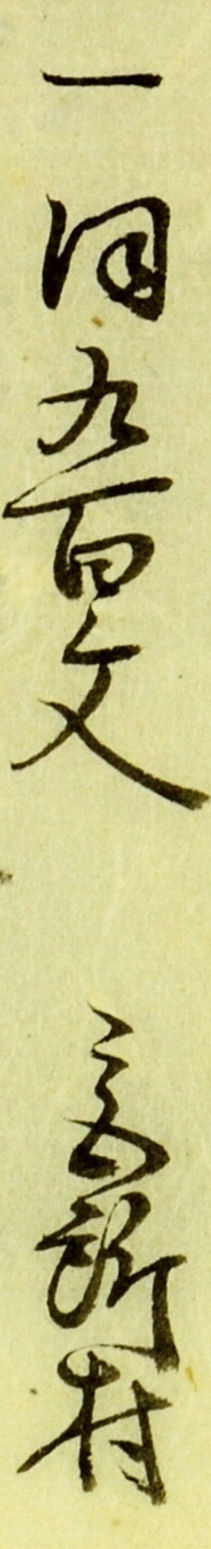一同九百文宮所村
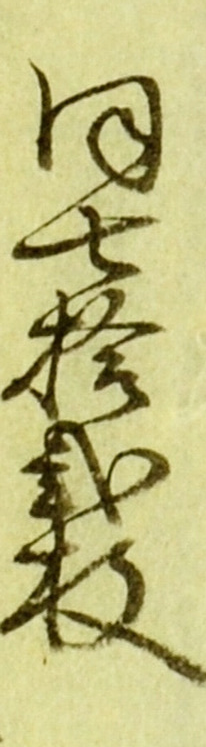同七拾弐枚
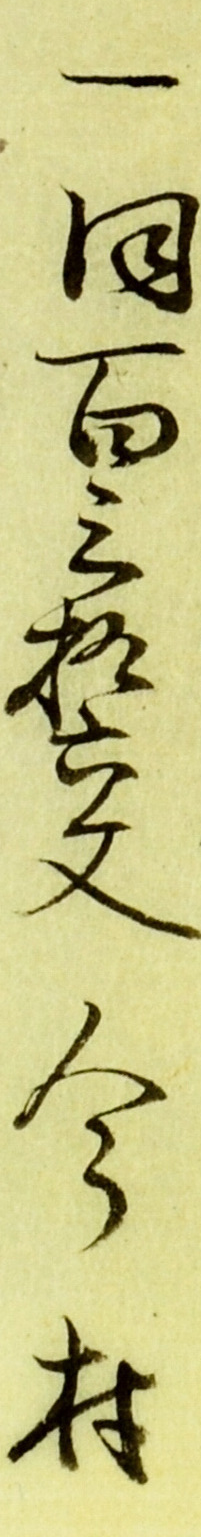一同百三拾六文今村
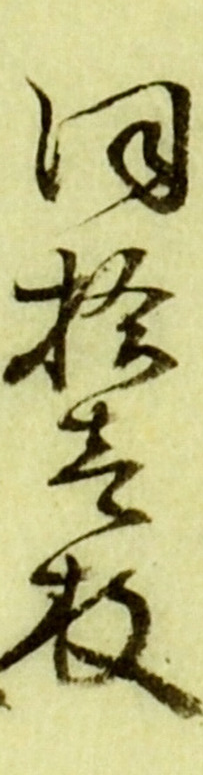同拾壱枚
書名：上伊那郷諸運上取調帳
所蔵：伊那市立高遠町図書館・合同会社AMANE
